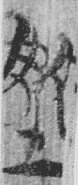○（地）
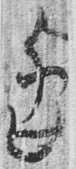旨
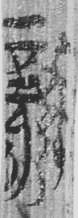○（握）
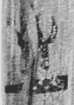之
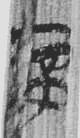不
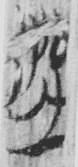浧（盈）
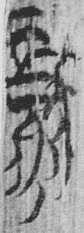○（握）
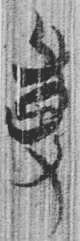尃
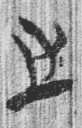之
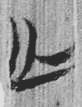亡（無）
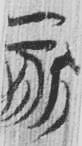所
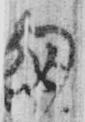含
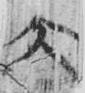大
